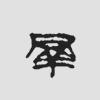群
